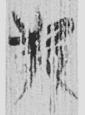弗
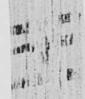王
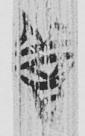善
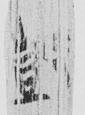○（矣）
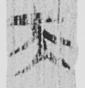夫
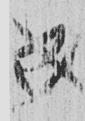𡚦（焉）
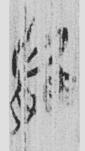能
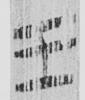王
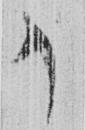人
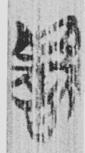䌛（由）
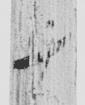子
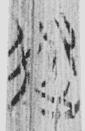○（過）
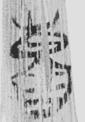{東日}（曹）
